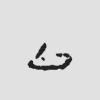㠯（以）
